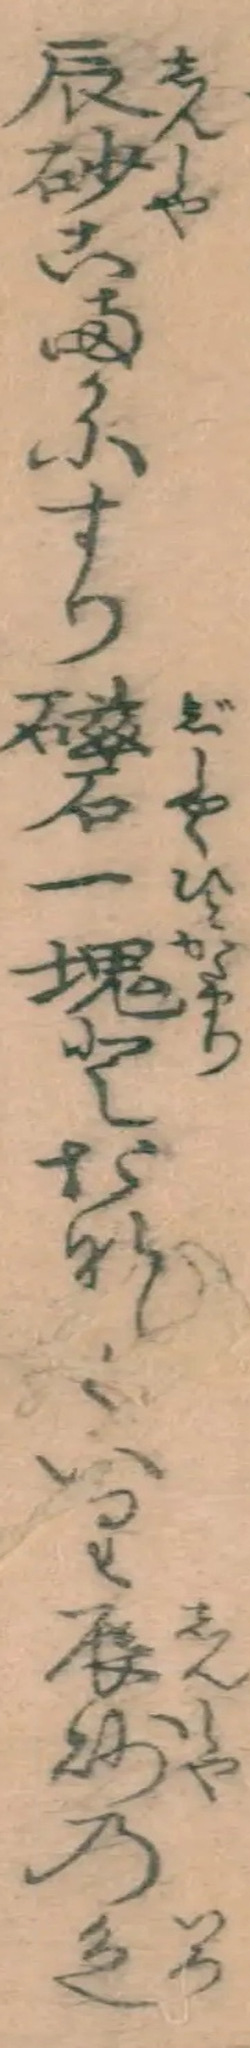辰砂こまかにすり磁石一塊とおなしくいり辰砂の色
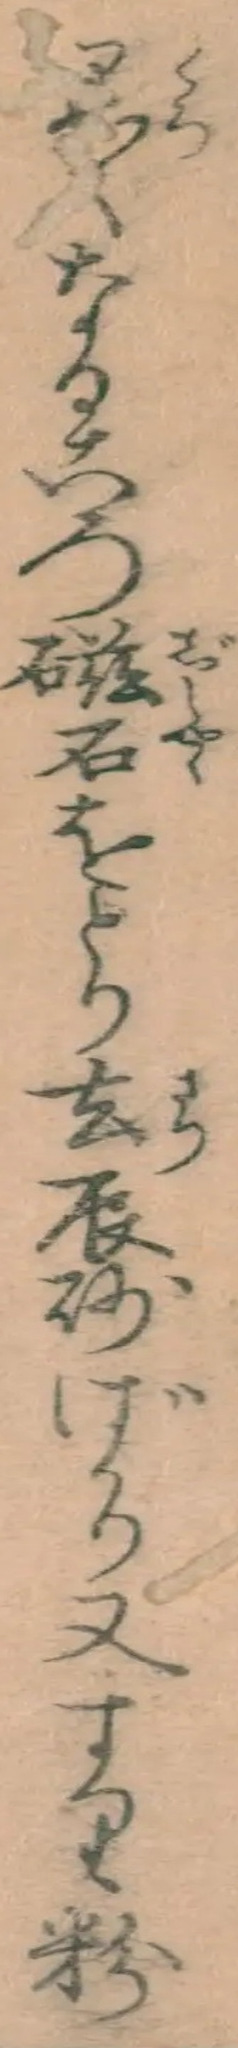黒くなるころ磁石をとり去辰砂ばかり又すり粉
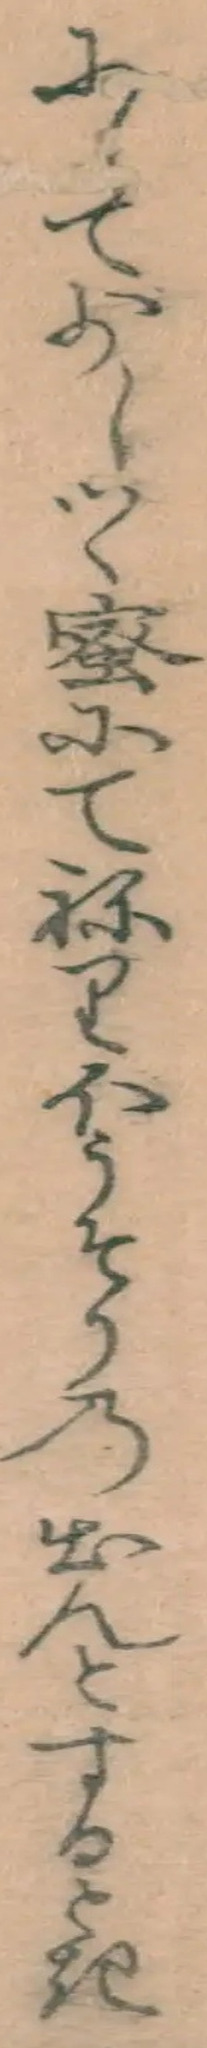にして少しつゝ蜜にてねりほうそうの出んとするとき
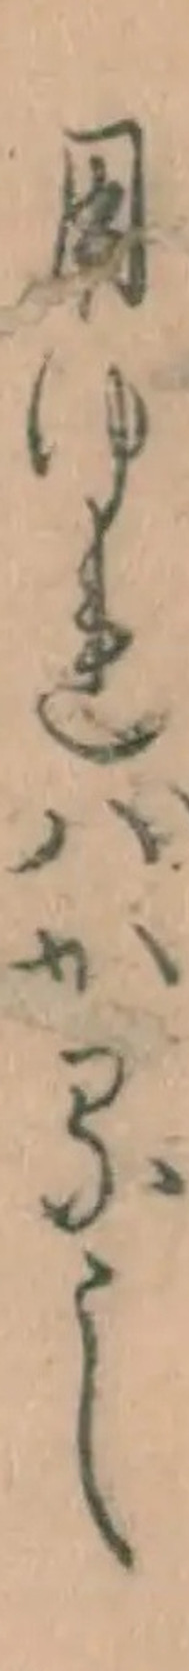用ゆればかるし
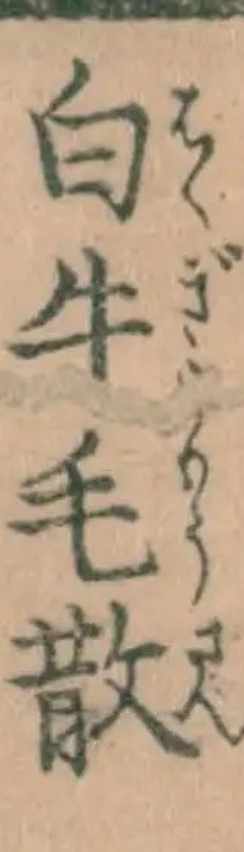白牛毛散

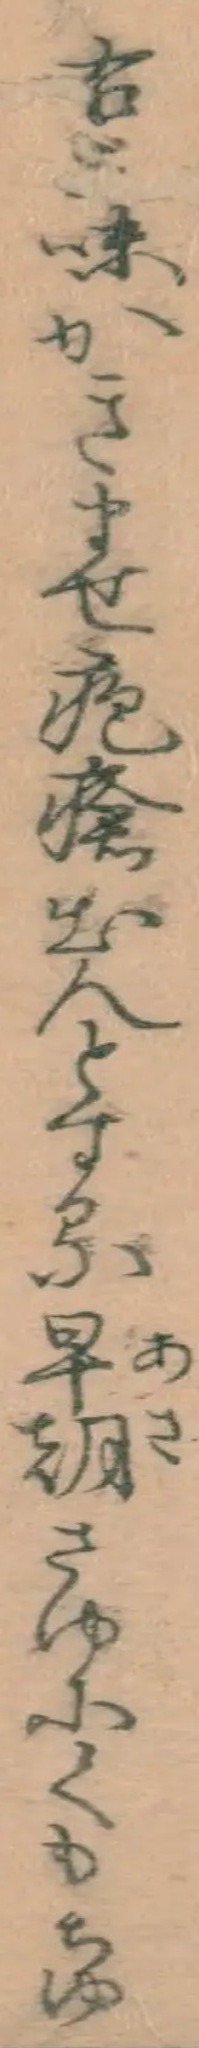右▢味かきませ疱瘡出んとする早朝さゆにてもちゆ
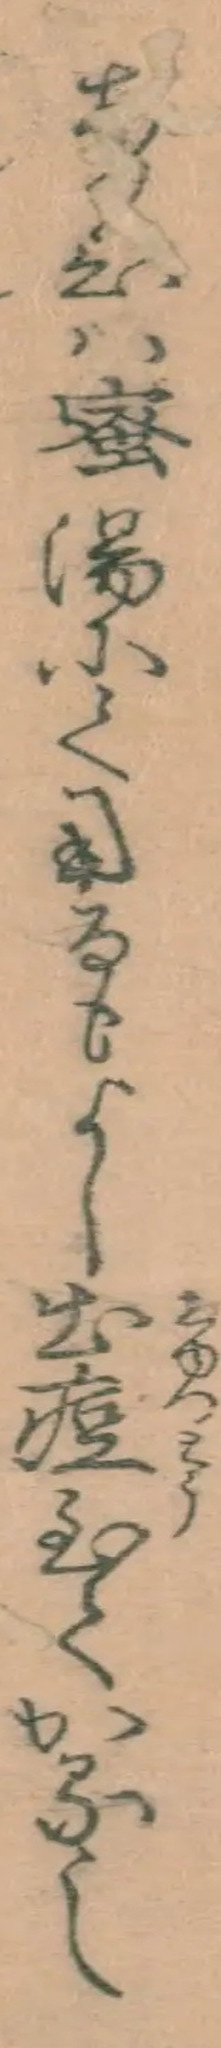▢▢至は蜜湯にて用るもよし出痘至てかるし
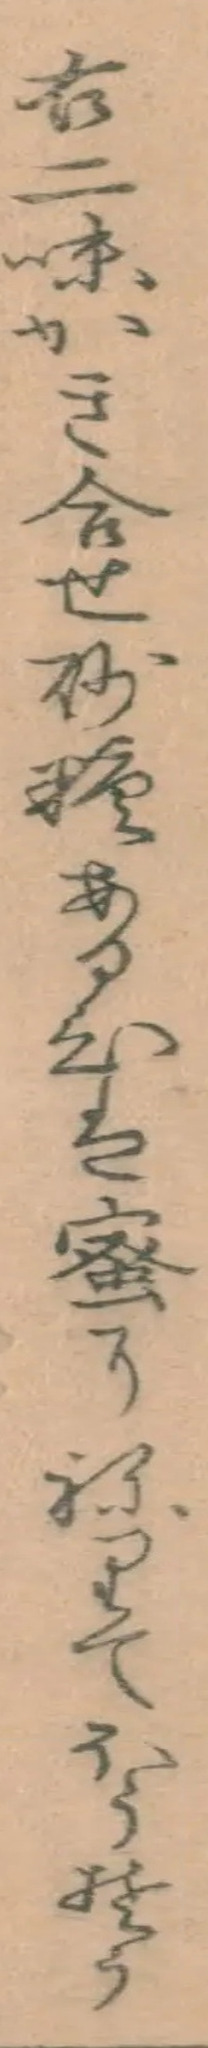右二味かき合せ砂糖あるひは蜜にねりてほうそう
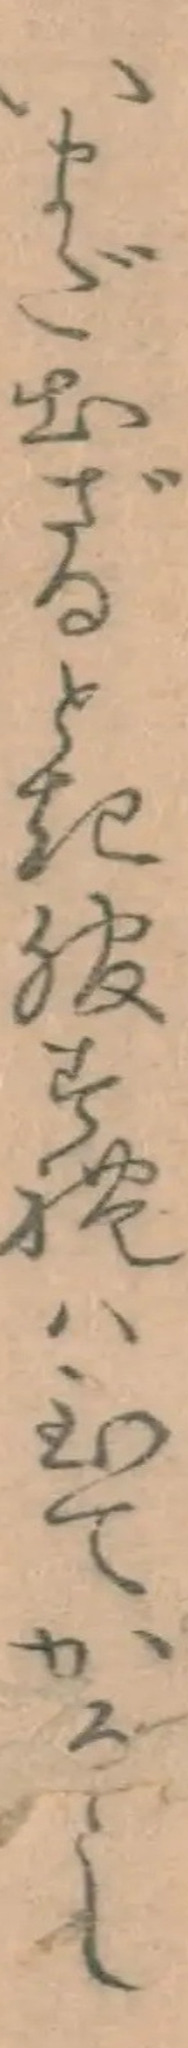いまだ出ざるとき服すれは至てかるし
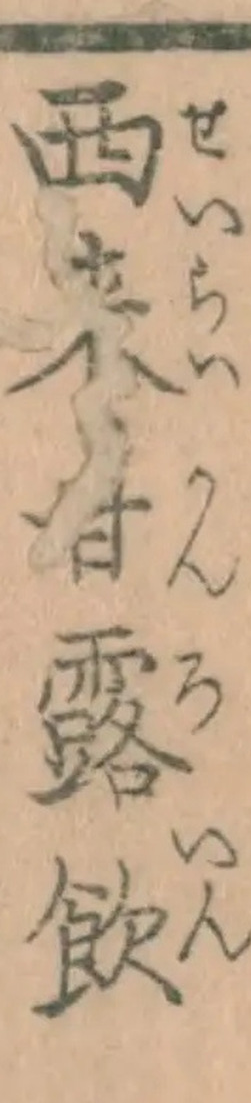西来甘露飲
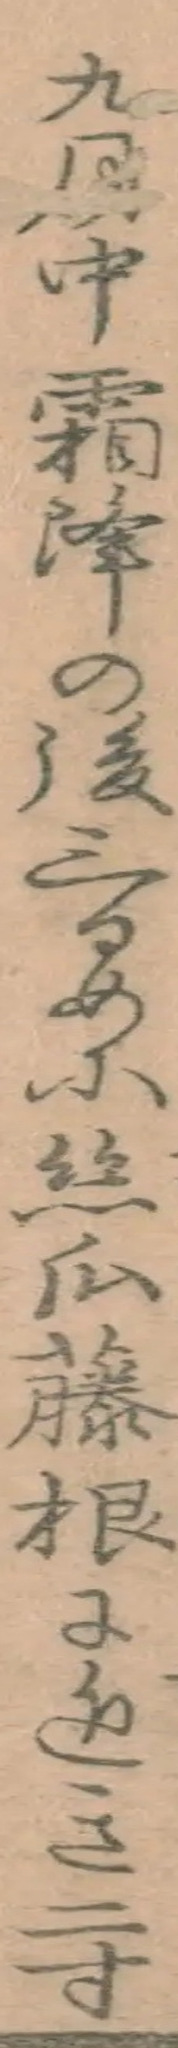九月中霜降の後三日めに糸瓜藤根に近き二寸
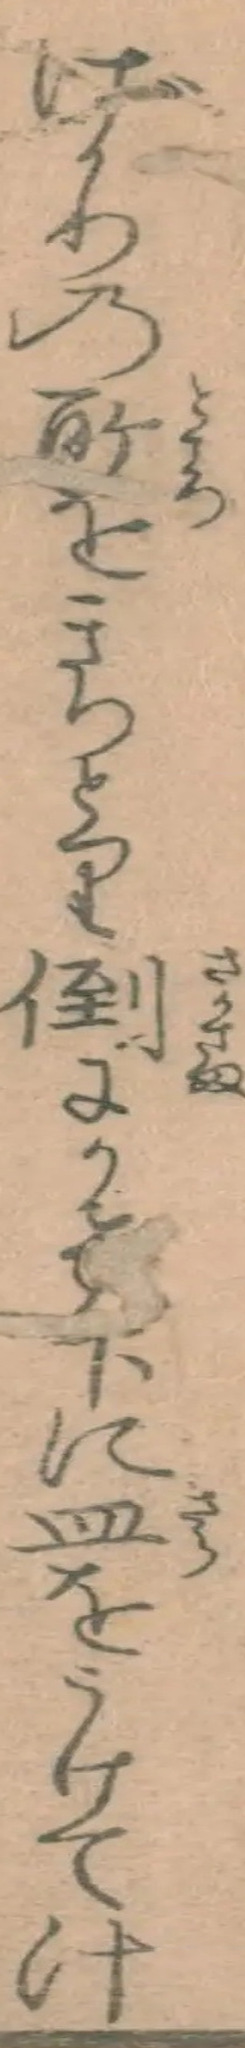ばかりの所をきりとり倒にか▢下に皿をうけて汁
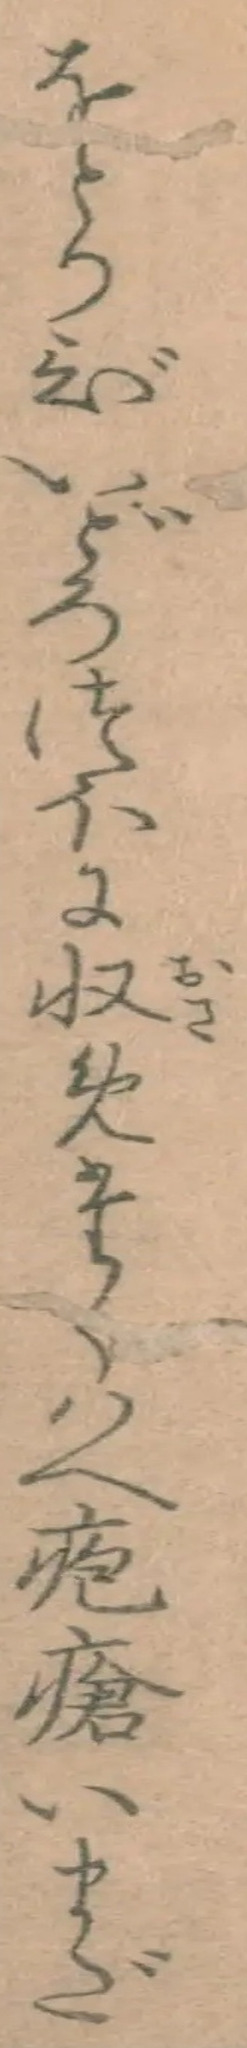をとりびいどろつほに収めたくはへ疱瘡いまだ

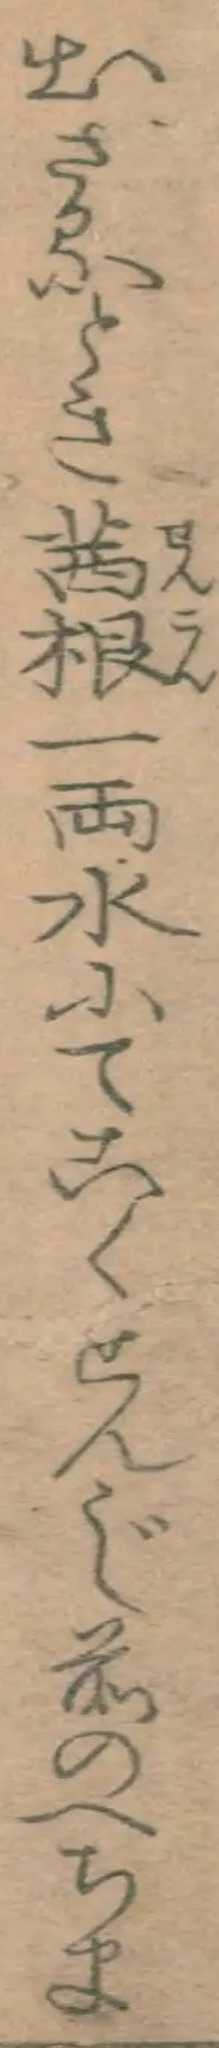出さるとき茜根一両水にてこくせんじ前のへちま
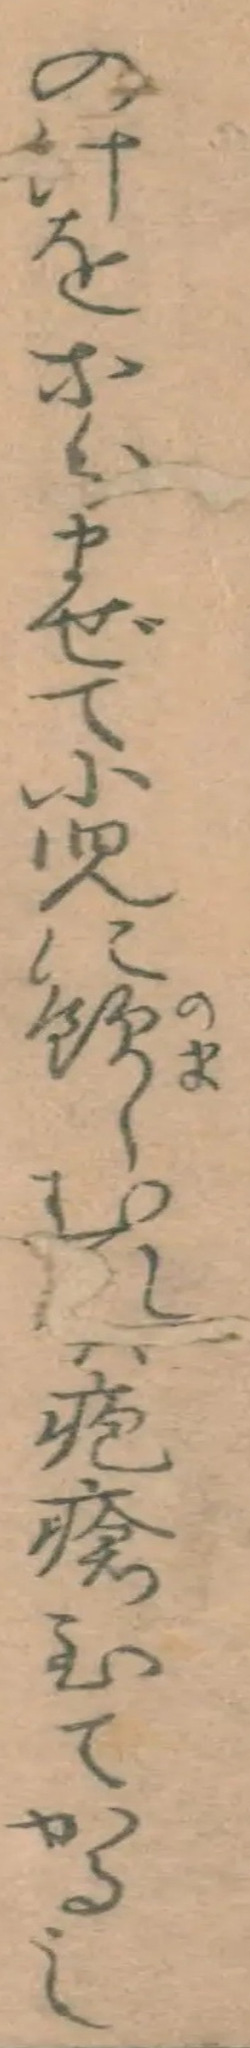の汁を等分まぜて小児に飲しむ▢は疱瘡至てかるし
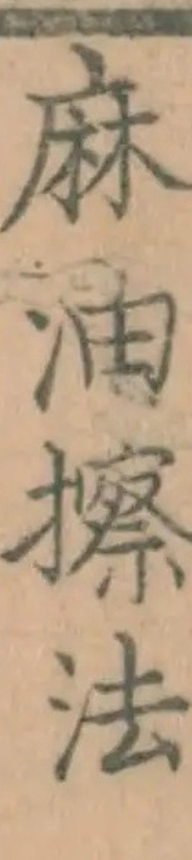麻油擦法
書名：雨夜談
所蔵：国立国会図書館 National Diet Library, JAPAN
